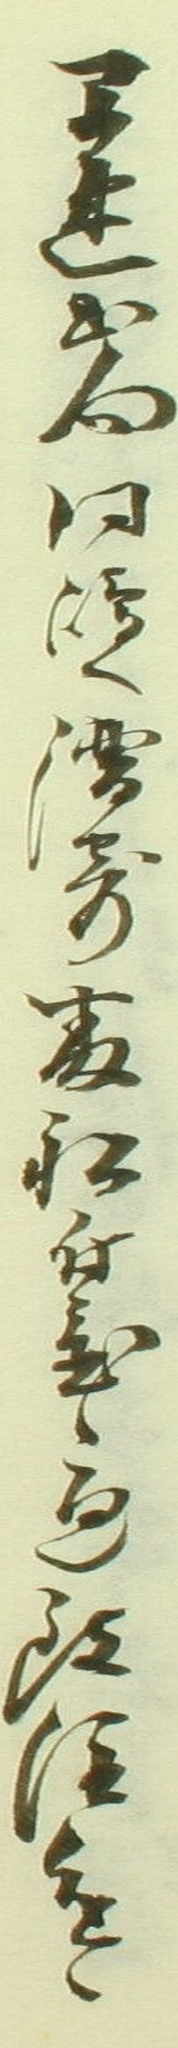早速出向同嶋へ漕寄番船付置候通致注進候
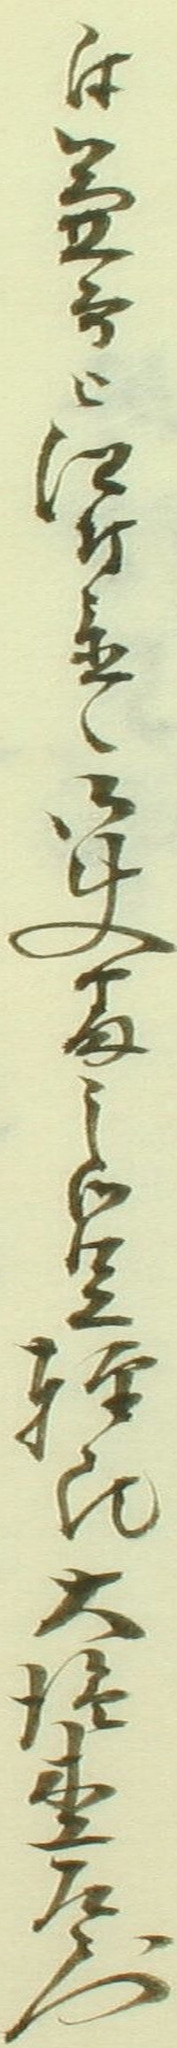付兼而被仰付置候御使番之御足軽頭大塩杢左衛門
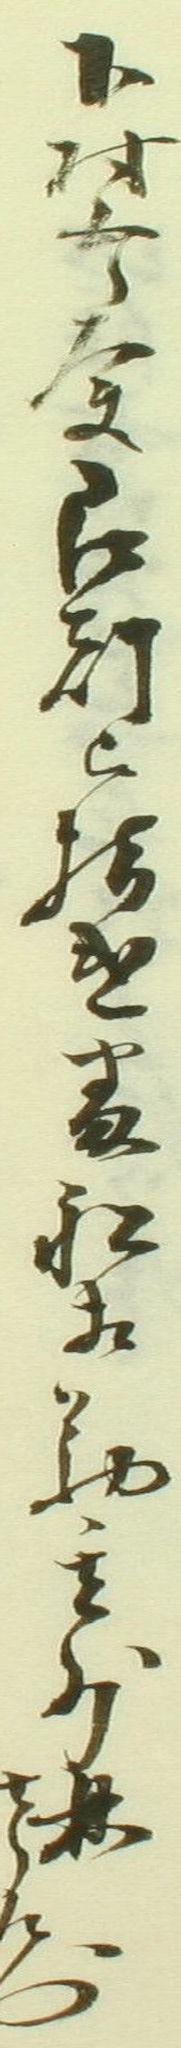下村五郎太夫即刻被指遣番船相勤其外林七郎左衛門
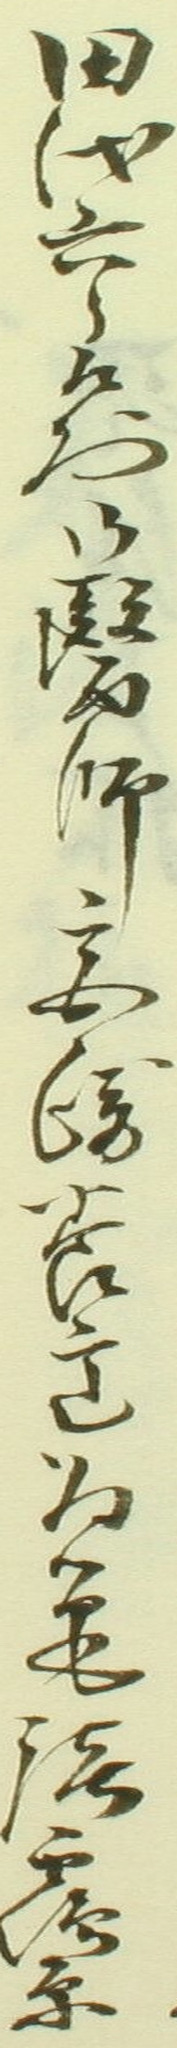田代六郎左衛門御医師宮崎養意為筆談靏原
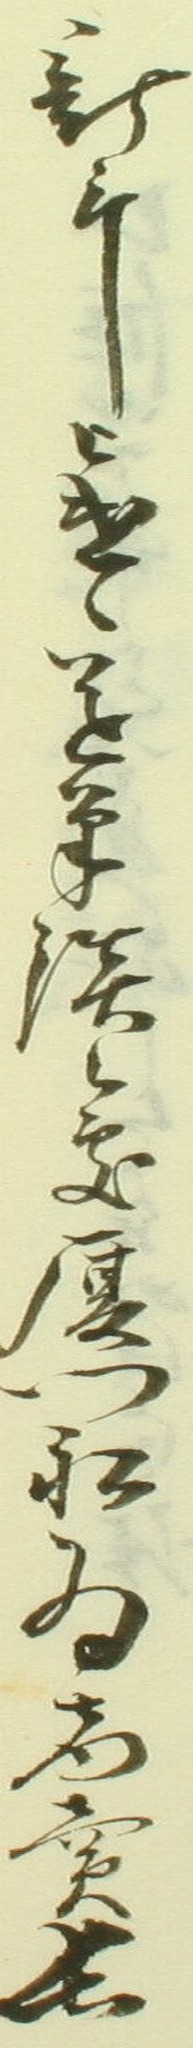新平被遣候遂筆談候処厦門船為商売長
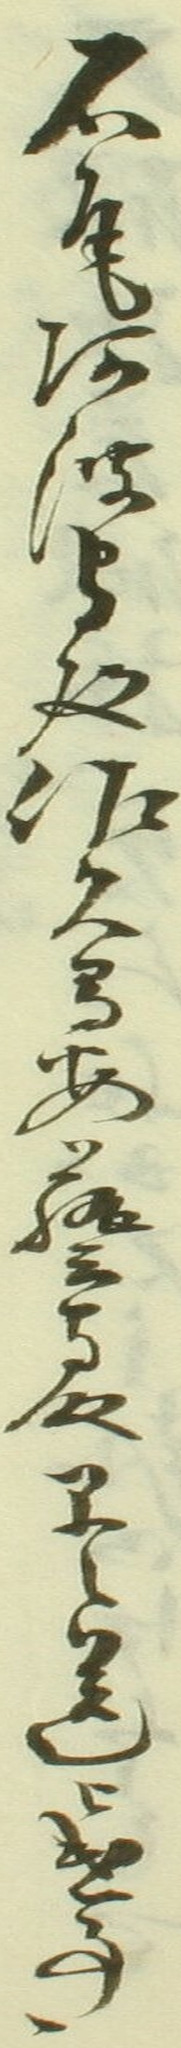石尾阿波守殿佐久間安芸守殿早々送被遣事
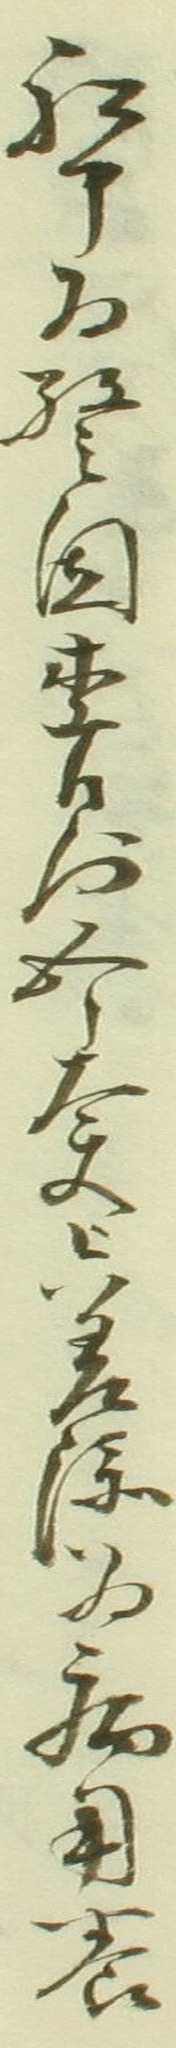船申為警固杢左衛門五郎太夫被差添為病用養
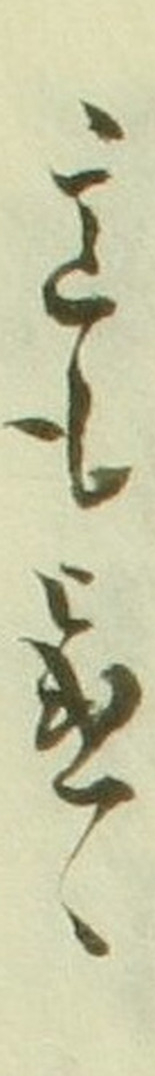意も被遣候
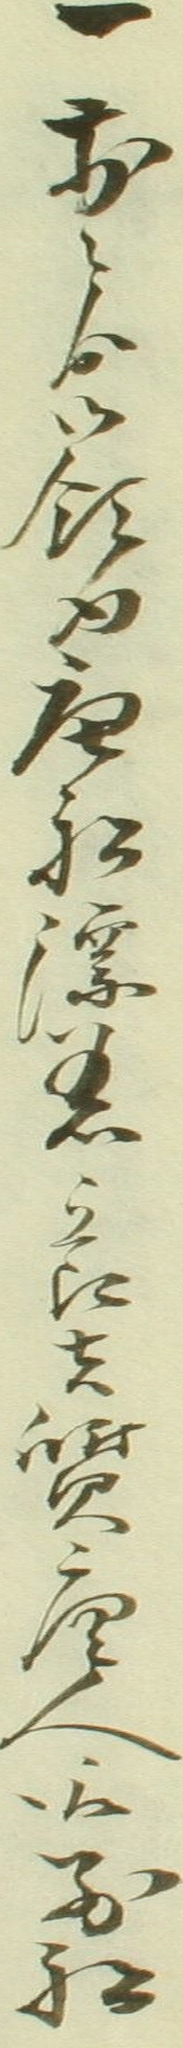一前々ゟ御領内唐船漂着節者質唐人取別船
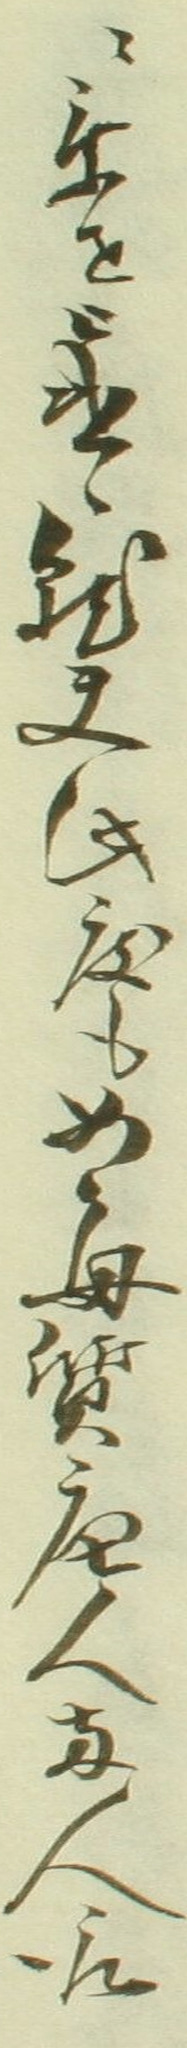二乗被遣候就夫此度も如毎質唐人両人取
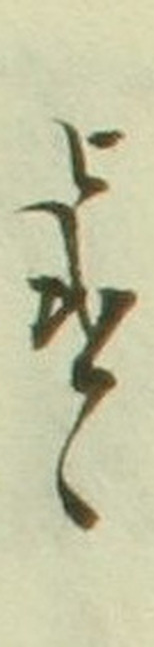被遣候
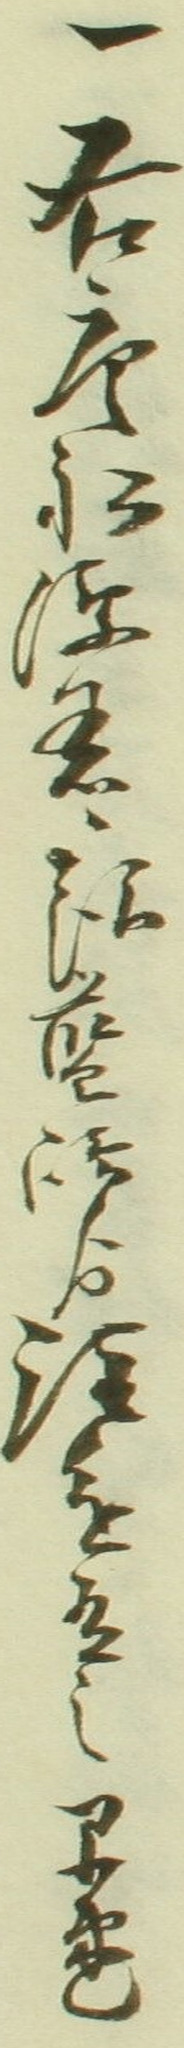一右唐船漂着之趣藍嶋ゟ注進有之早速
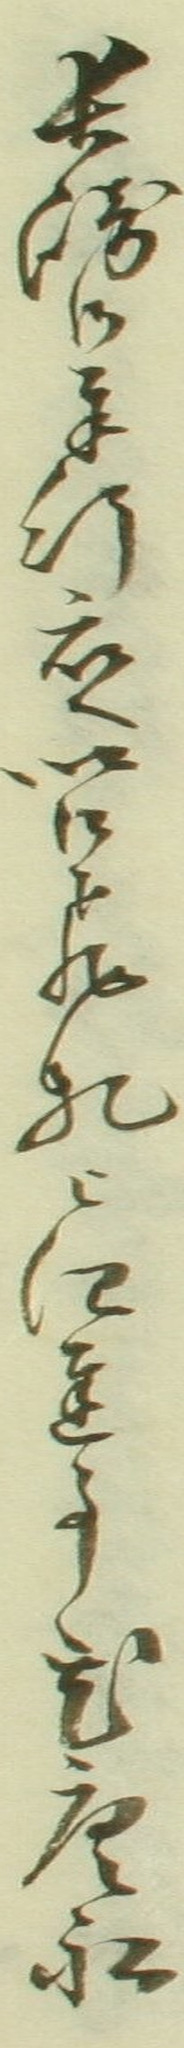長崎御奉行衆へ以飛札被仰達事尤唐船
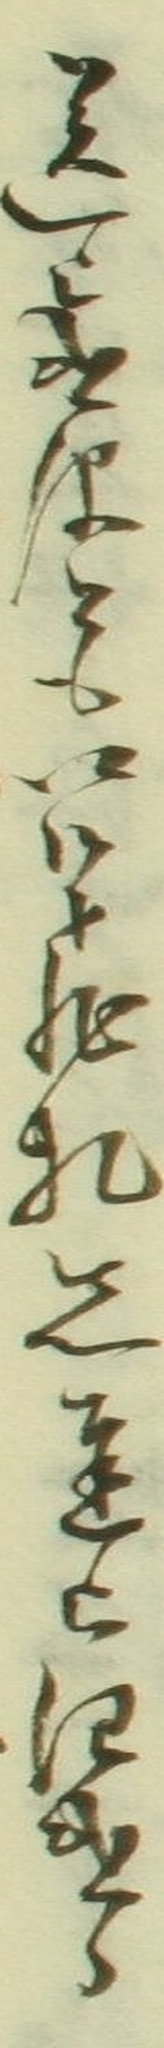送被遣儀とも以御飛札先達被仰遣候

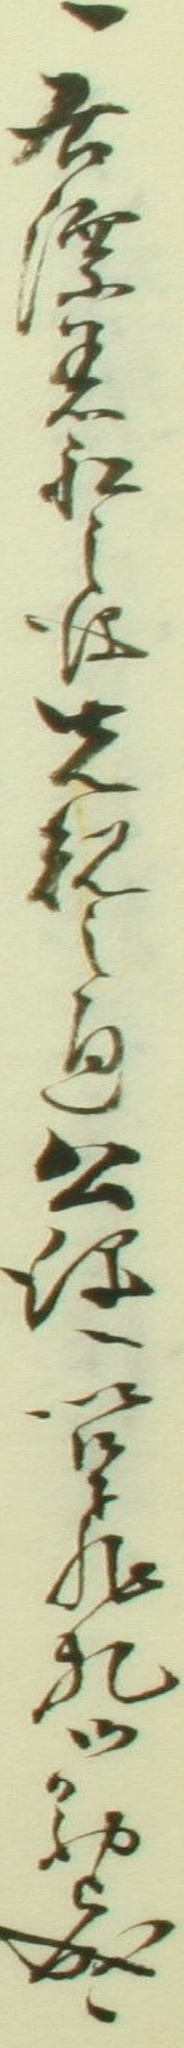一右漂着船之儀先規之通公儀へ以飛札御勤被成候
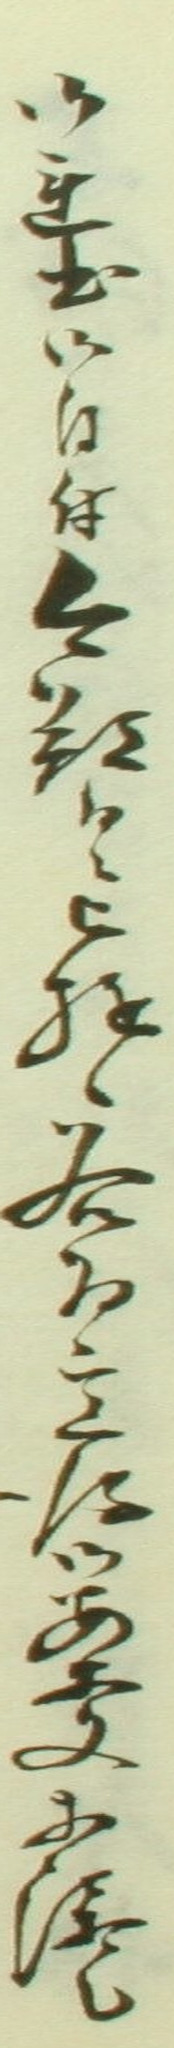御連書御日付今朔日ニ被遊候各為意得御案文相添候
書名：異国船漂着記
